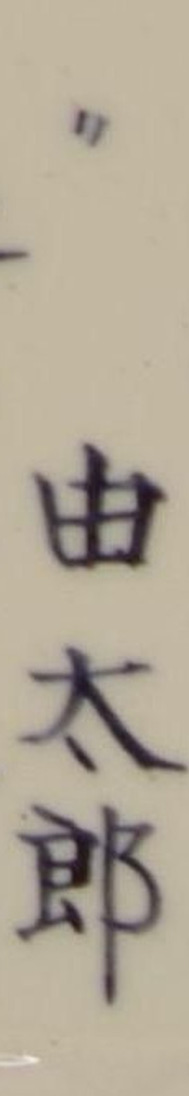由太郎
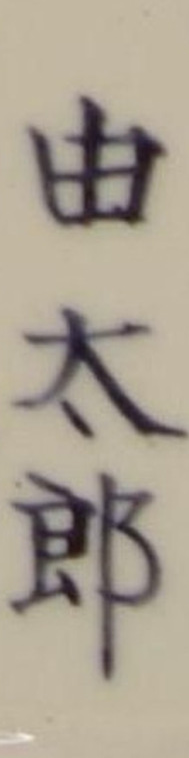由太郎
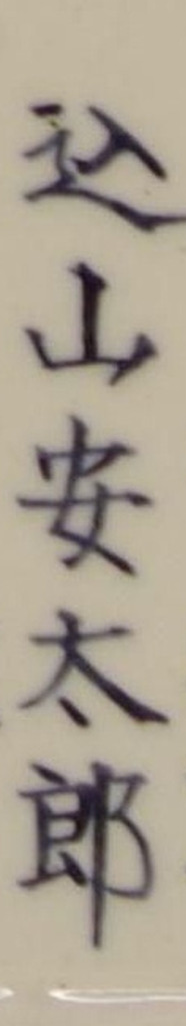込山安太郎
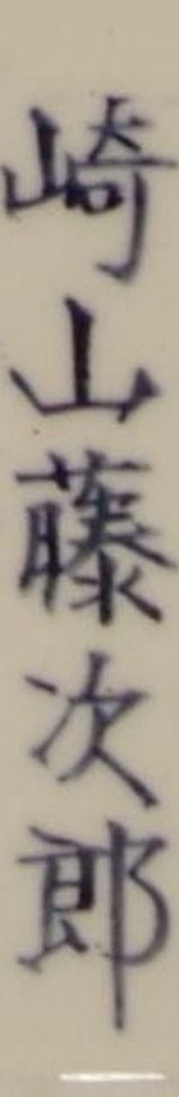崎山藤次郎
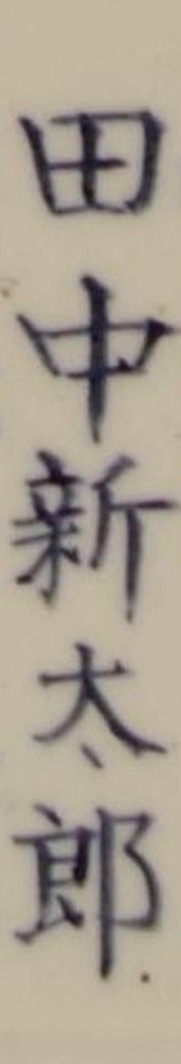田中新太郎
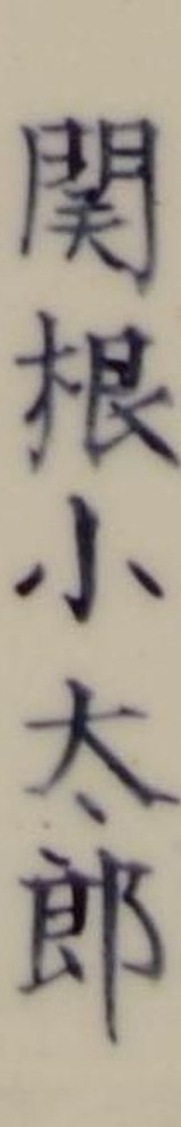関根小太郎
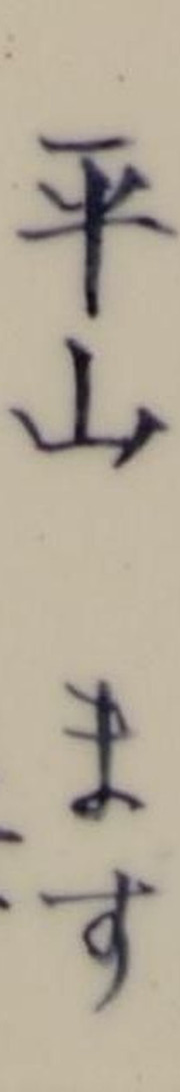平山ます
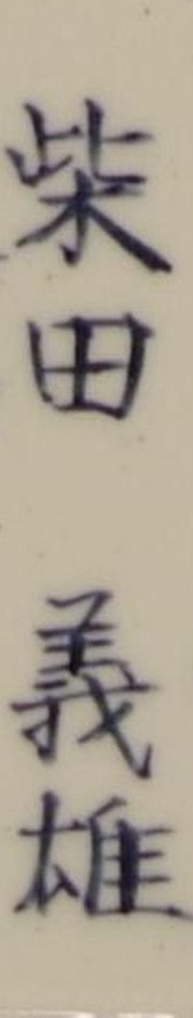柴田義雄
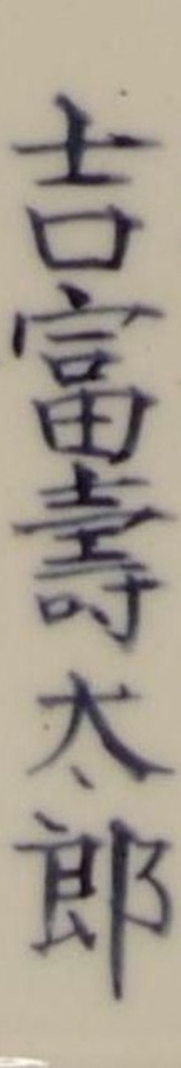吉富壽太郎
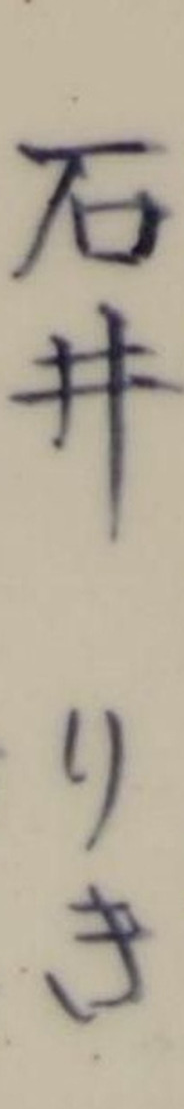石井りき
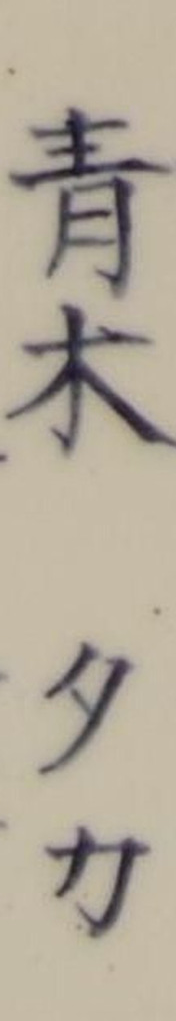青木タカ
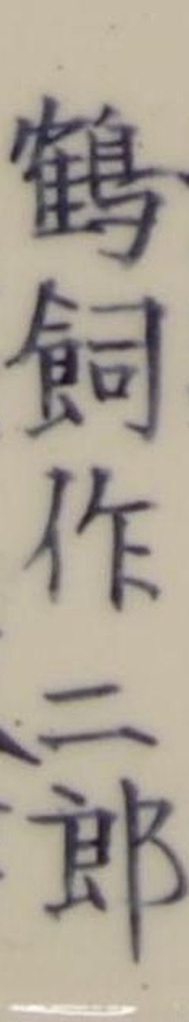鶴飼作二郎
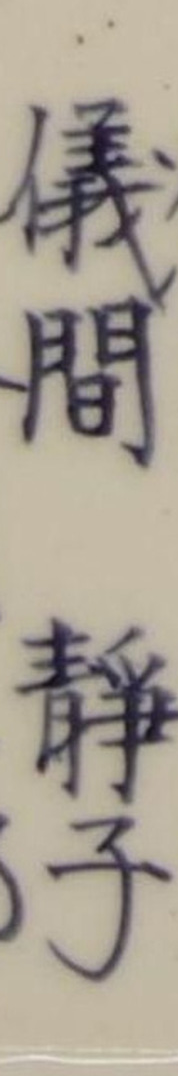儀間静子
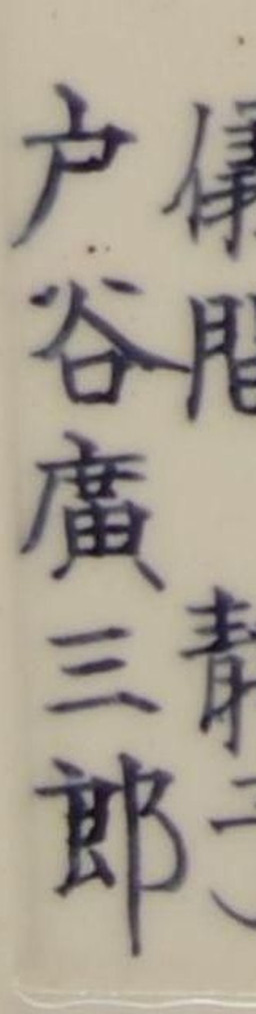戸谷廣三郎

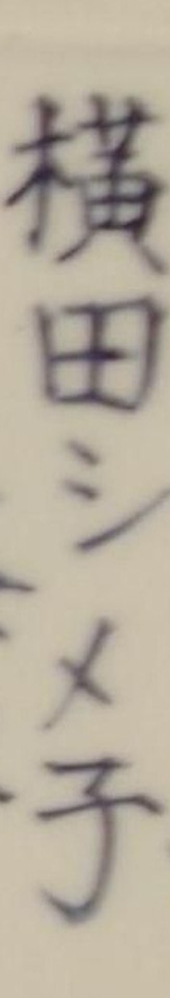横田シメ子
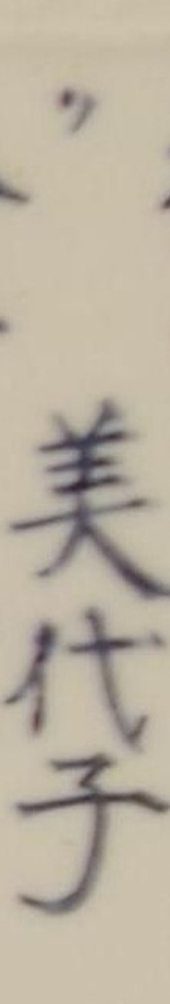美代子
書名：M~S
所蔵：高野山金剛峯寺
